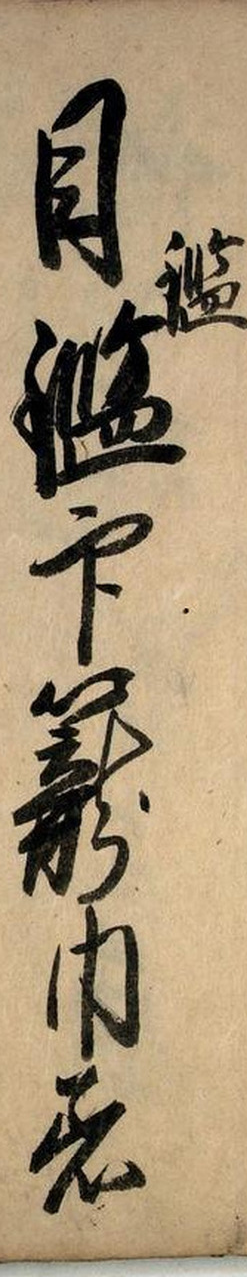目鑑印籠巾着
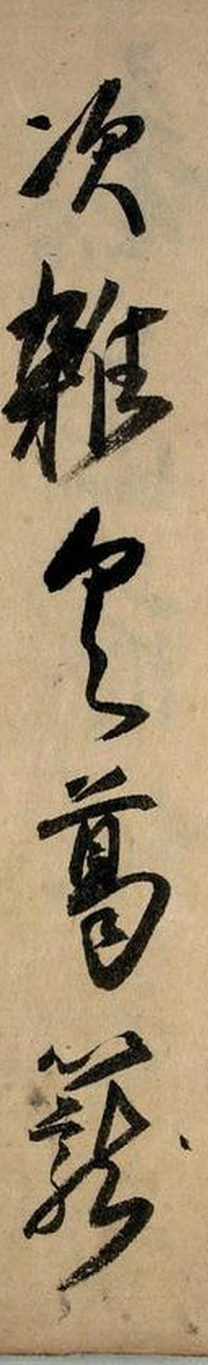次雑具葛籠
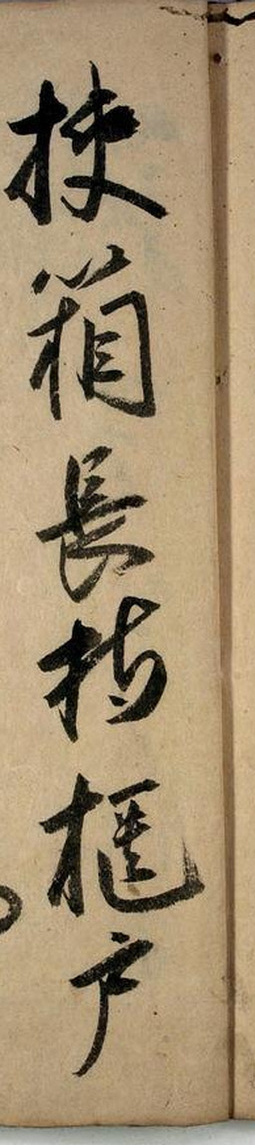挟箱長持櫃戸
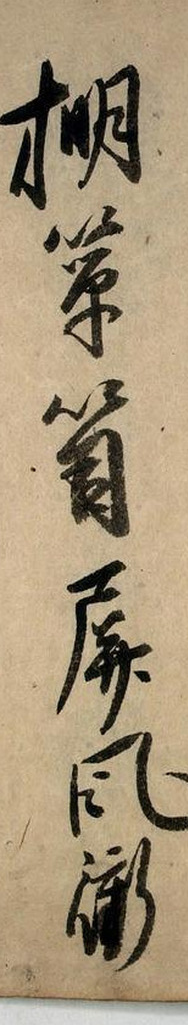棚箪笥屏風衝
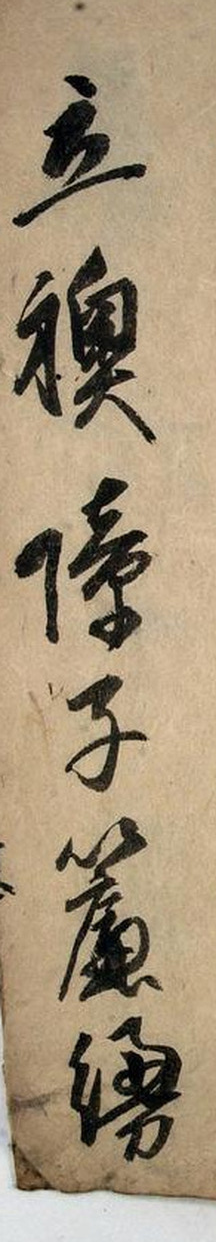立襖障子簾縵

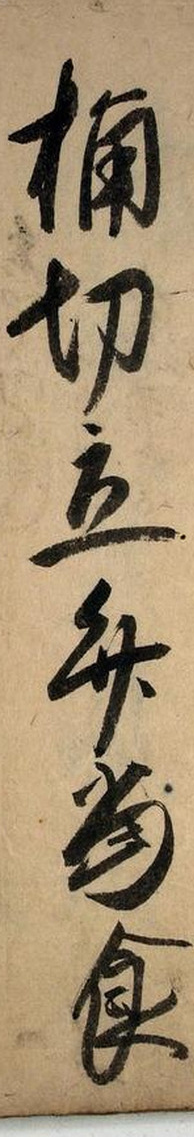桶切立弁当食
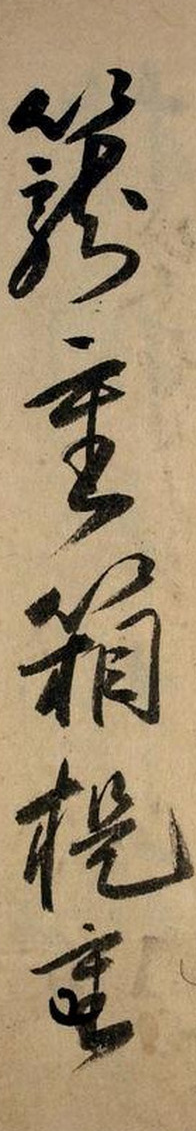籠重箱提重
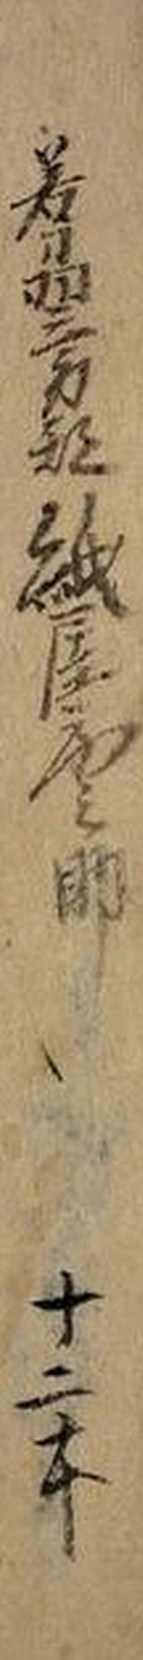若州三方郡紙屋市之助十二本
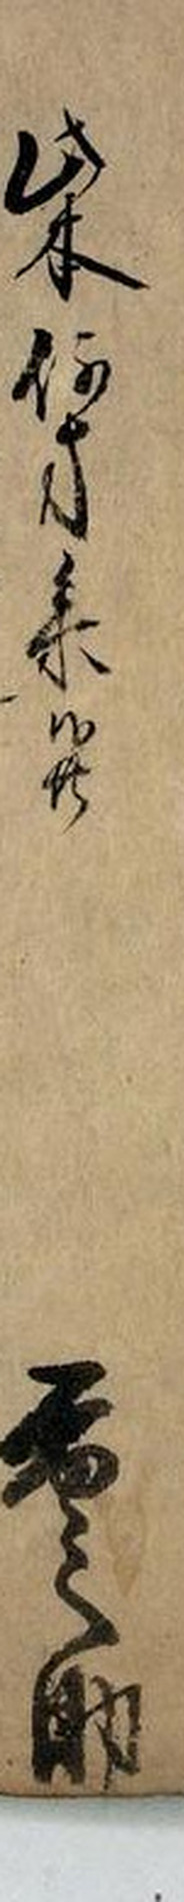此本何方参候共市之助
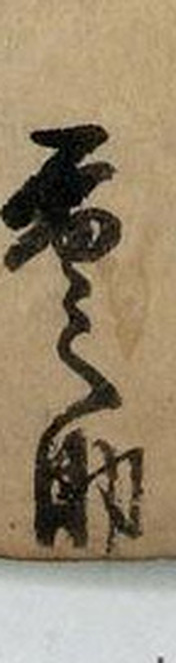市之助
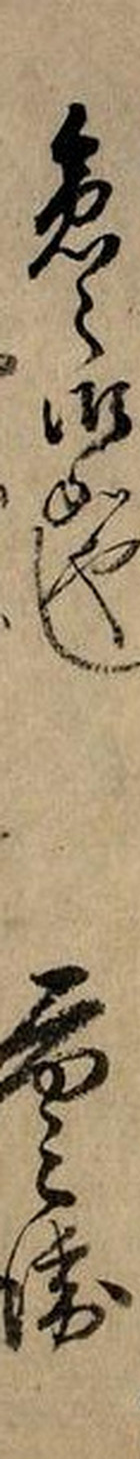急々御かやし市兵衛
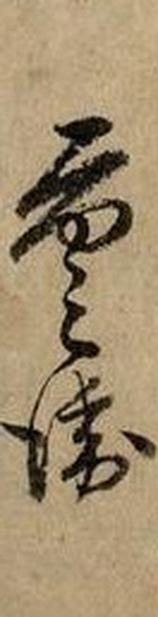市兵衛
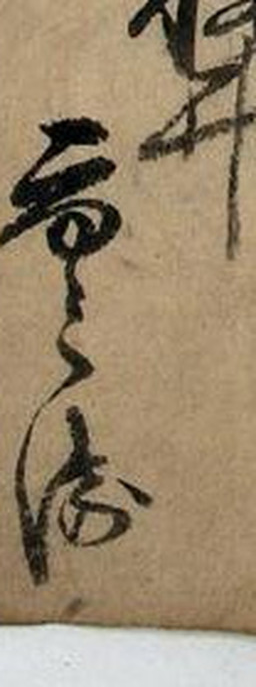市兵衛
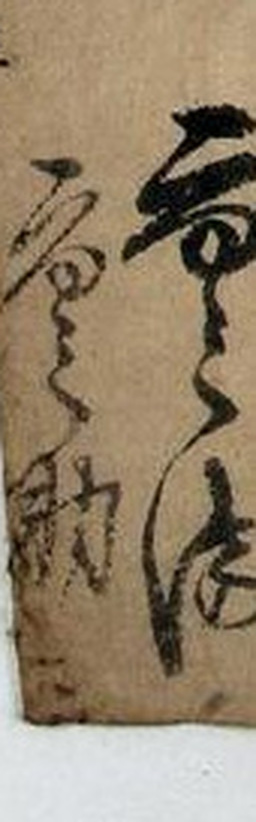市之助

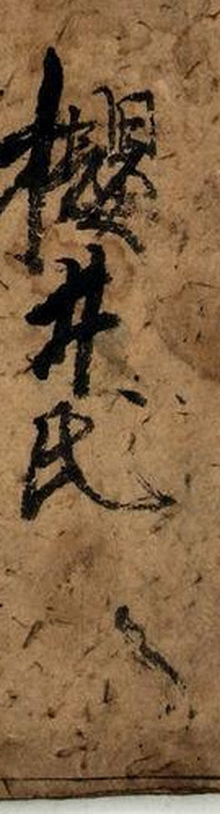桜井氏
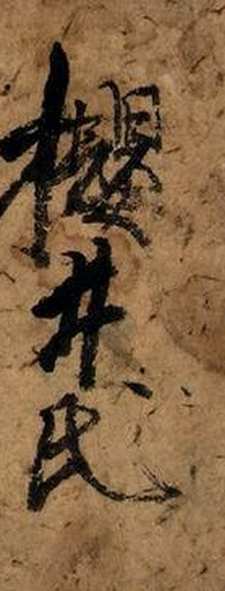桜井氏
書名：商売往来（往来物、手習、市之助・市兵衛の名もあり）
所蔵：福井県文書館 Fukui Prefectural Archives
